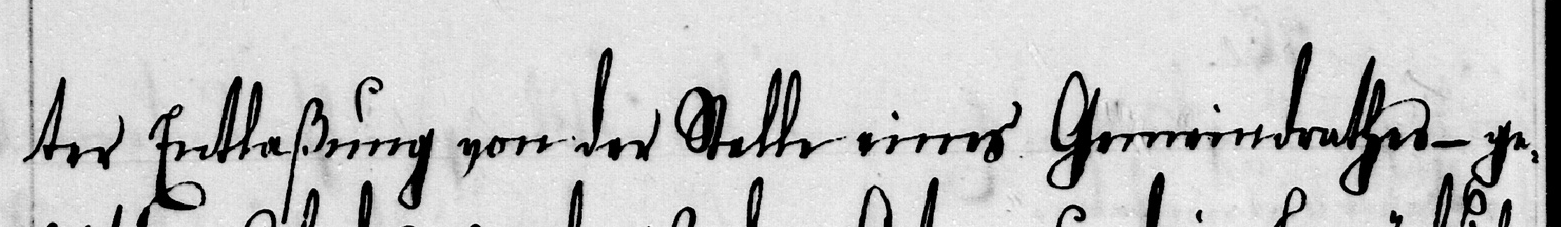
ter Entlaßung von der Stelle eines Gemeindrathes – ge¬
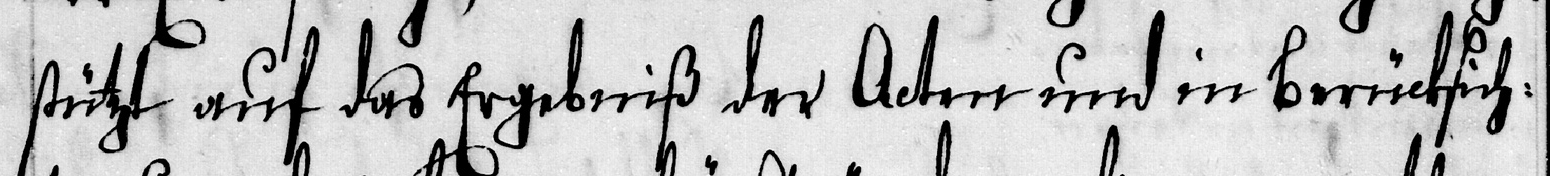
stützt auf das Ergebniß der Acten und in Berücksich¬
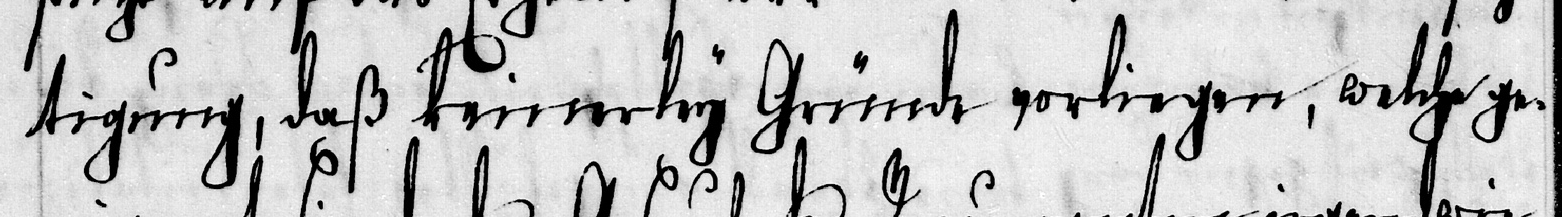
tigung, daß keinerley Gründe vorliegen, welche ge¬
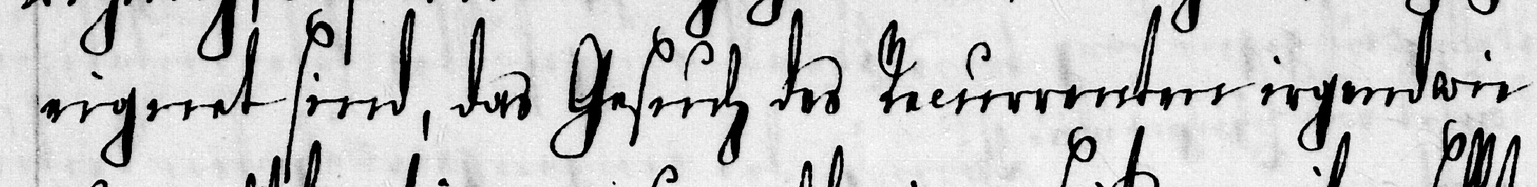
eignet sind, das Gesuch des Recurrenten irgendwie
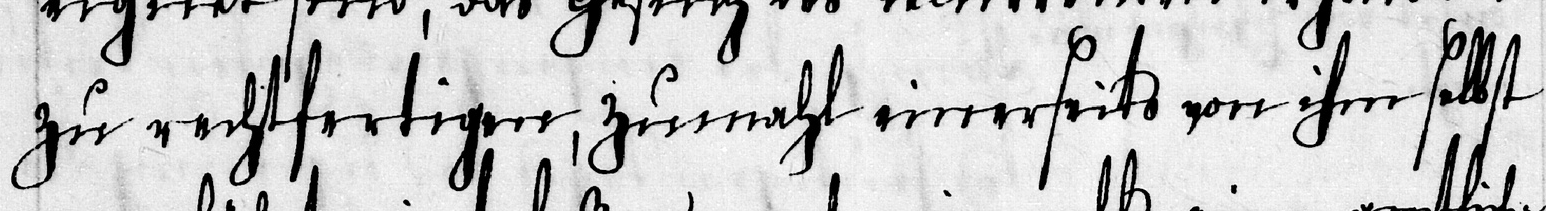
zu rechtfertigen, zumahl einerseits von ihm selbst
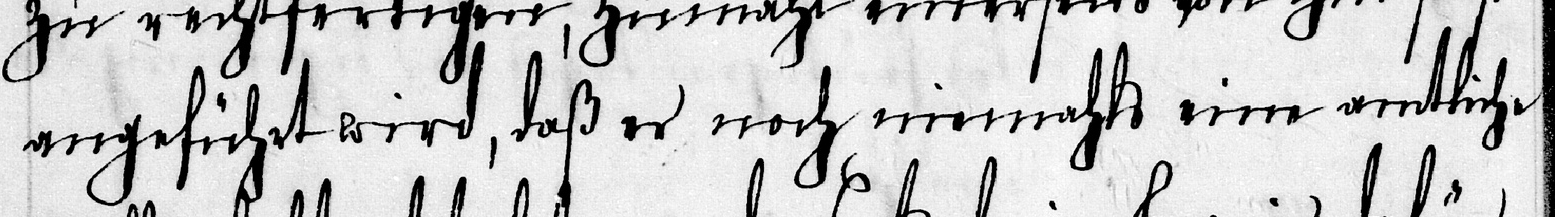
angeführt wird, daß er noch niemahls eine amtliche
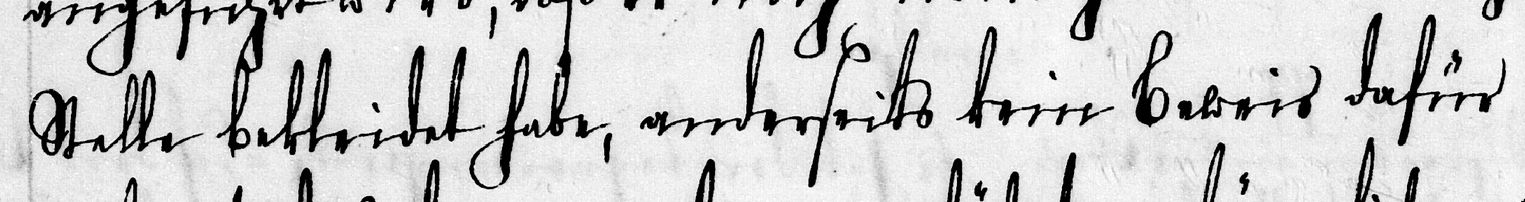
Stelle bekleidet habe, anderseits kein Beweis dafür
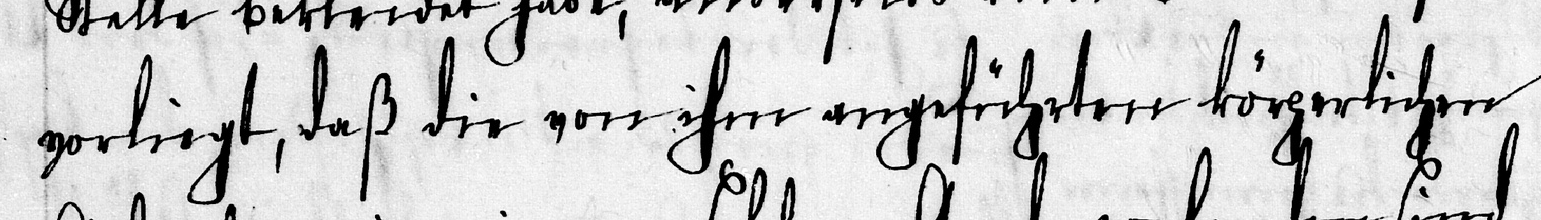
vorliegt, daß die von ihm angeführten körperlichen
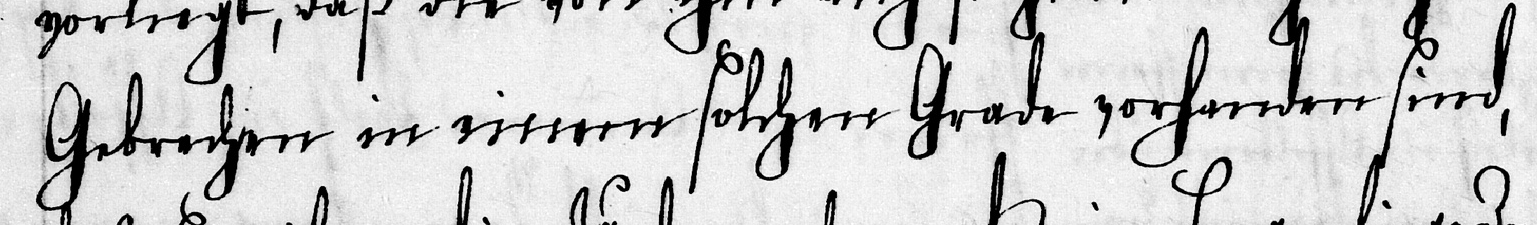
Gebrechen in einem solchen Grade vorhanden sind,
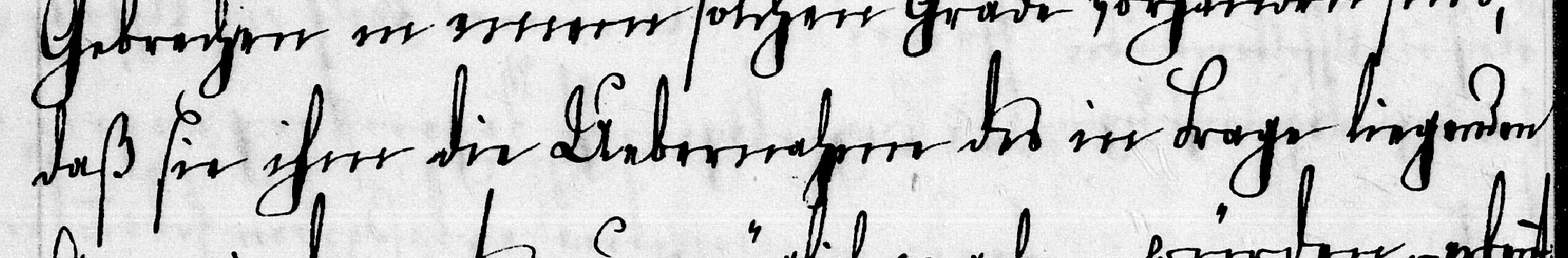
daß sie ihm die Uebernahme des in Frage liegenden
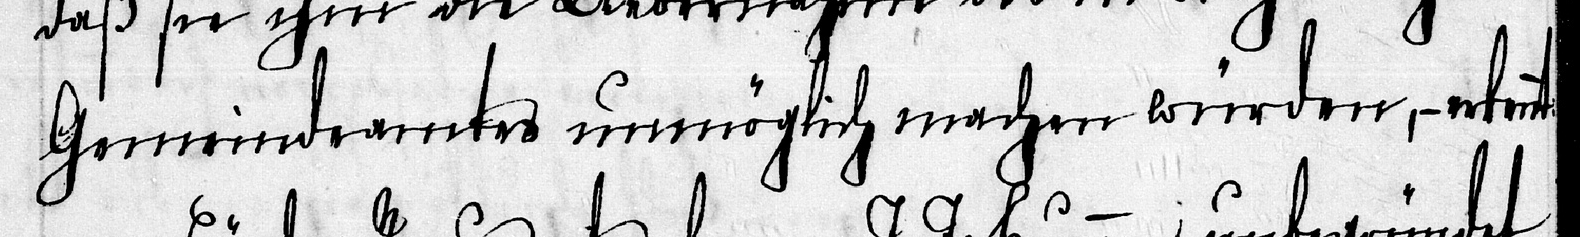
Gemeindeamtes unmöglich machen würden, – er¬
